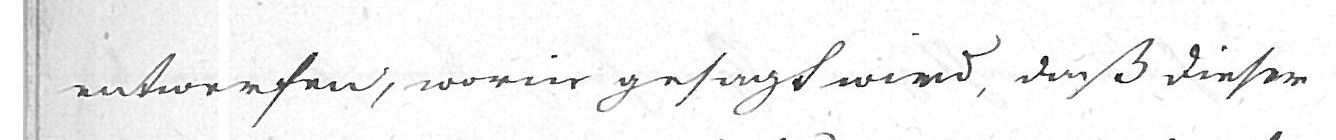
entwerfen, worin gesagt wird, daß dieser
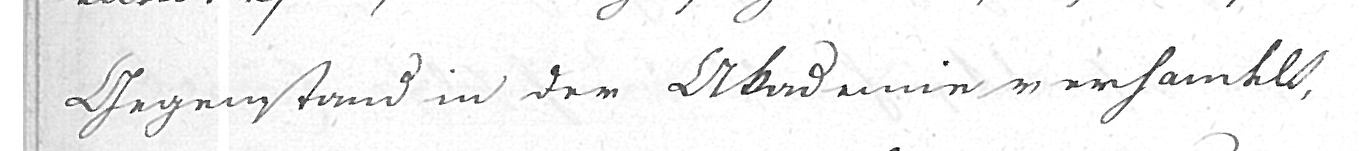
Gegenstand in der Akademie verhandelt
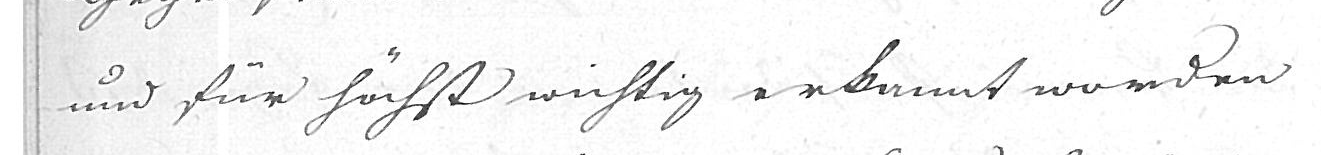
und für höchst wichtig erkannt worden
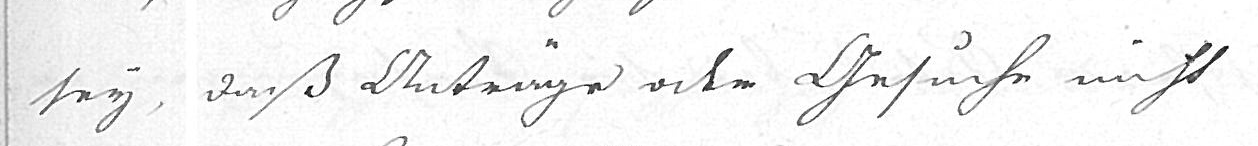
sey, daß Anträge oder Gesuche nicht
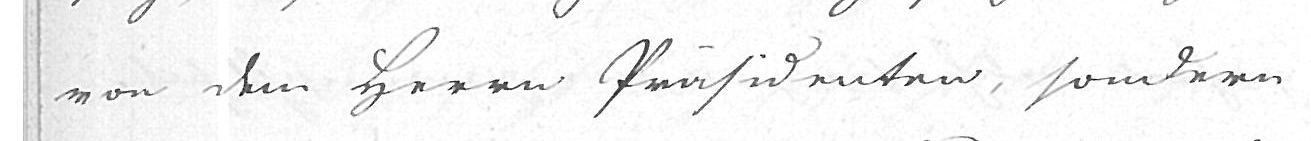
von dem Herrn Präsidenten, sondern
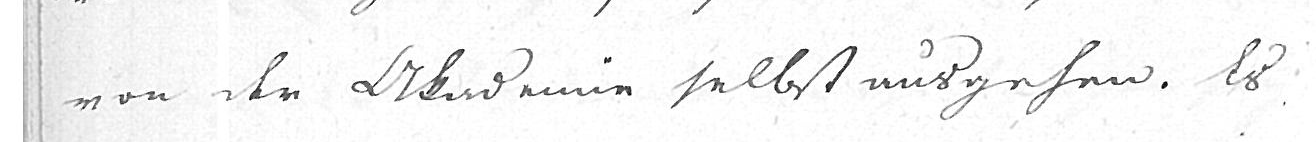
von der Akademie selbst ausgehen. Es
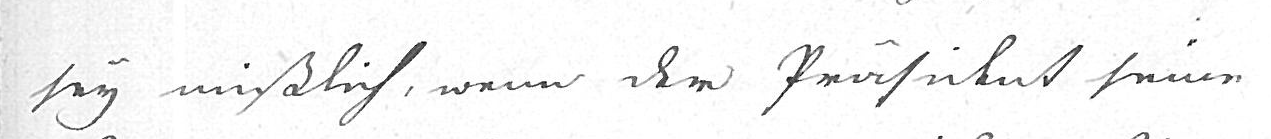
sey mißlich, wen der Präsident seine
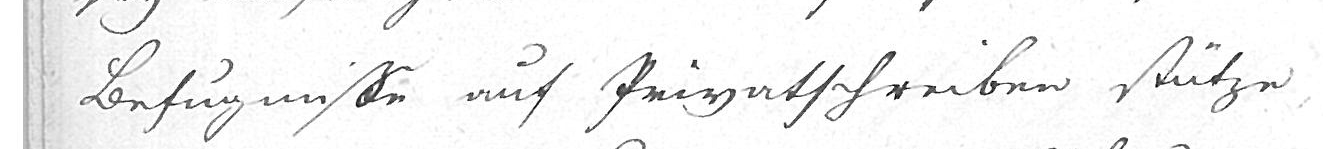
Befugnisse auf Privatschreiben stütze,
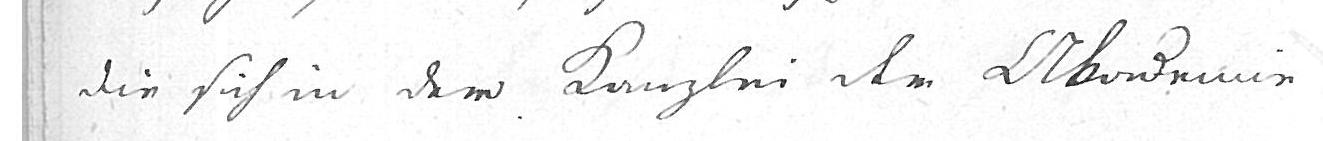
sie sich in der Kanzlei der Akademie
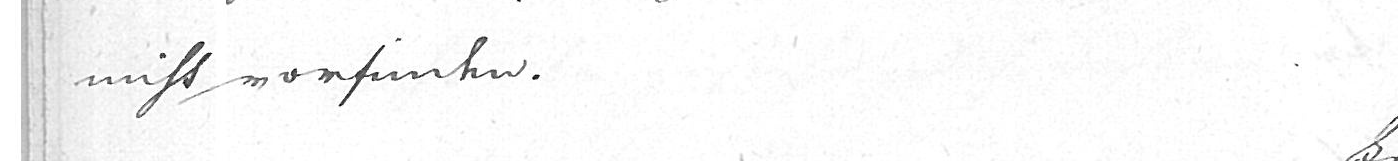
nicht vorfinden.
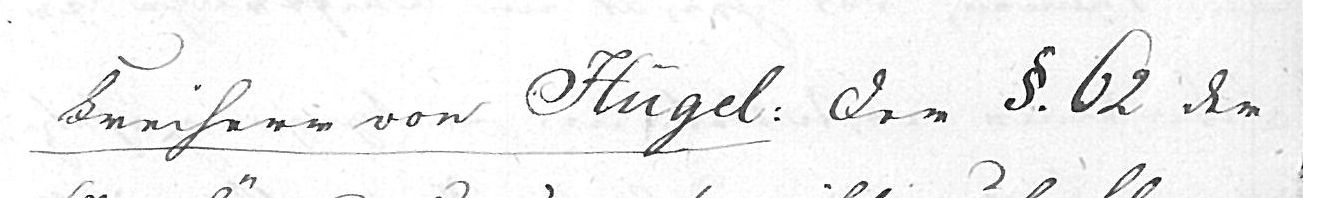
Freiherr von Hügel: Der §. 62 der
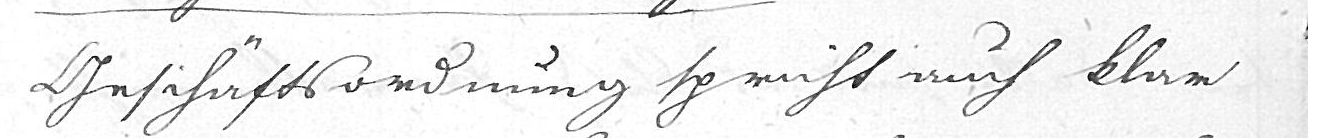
Geschäftsordnung spricht auch klar
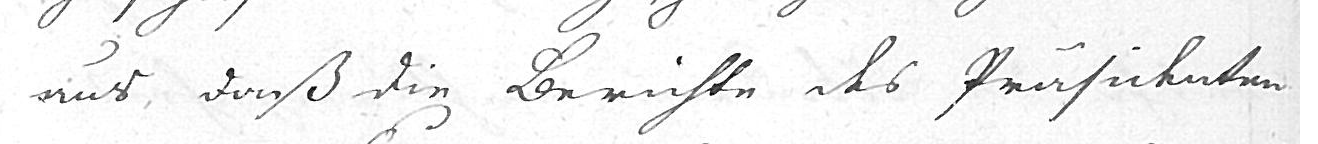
aus, daß die Berichte des Präsidenten
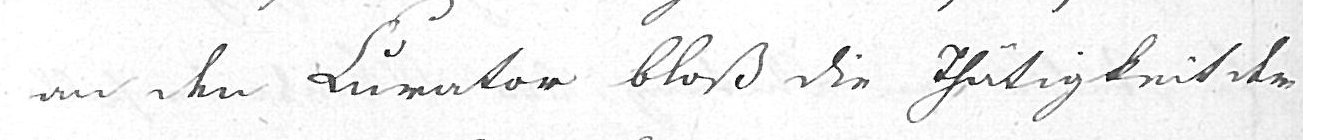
an den Curator bloß die Thätigkeit der
